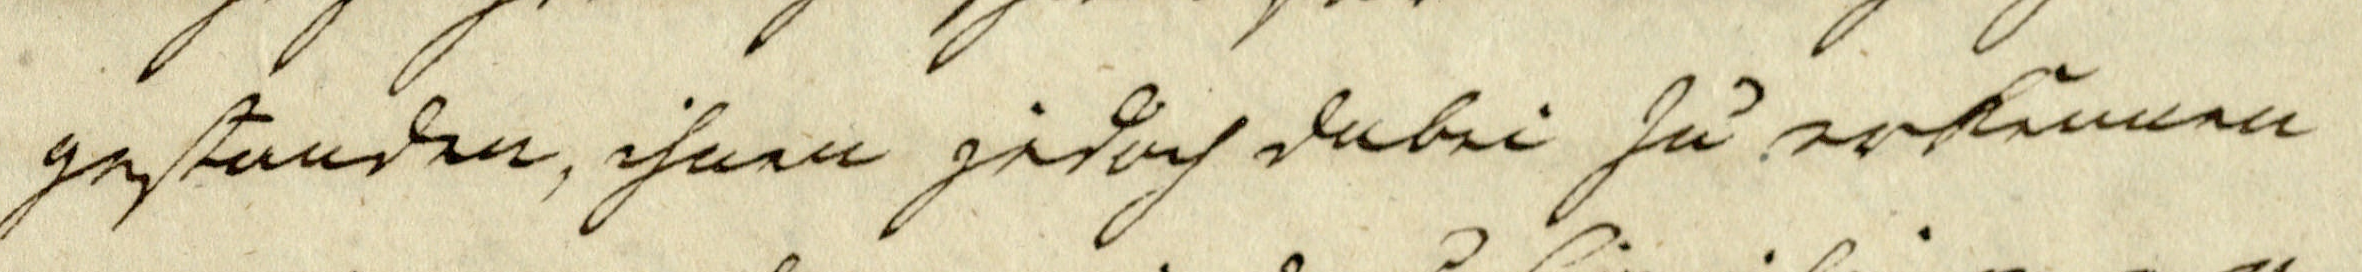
gestanden, ihnen jedoch dabei zu erkennen
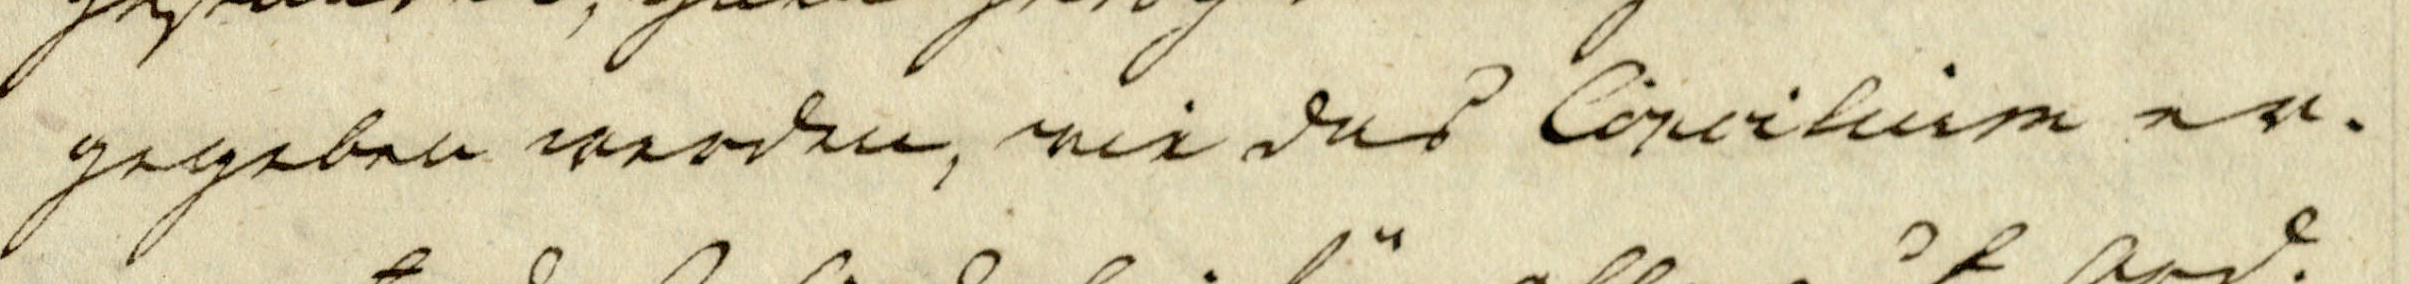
gegeben werden, wie das Concilium er¬
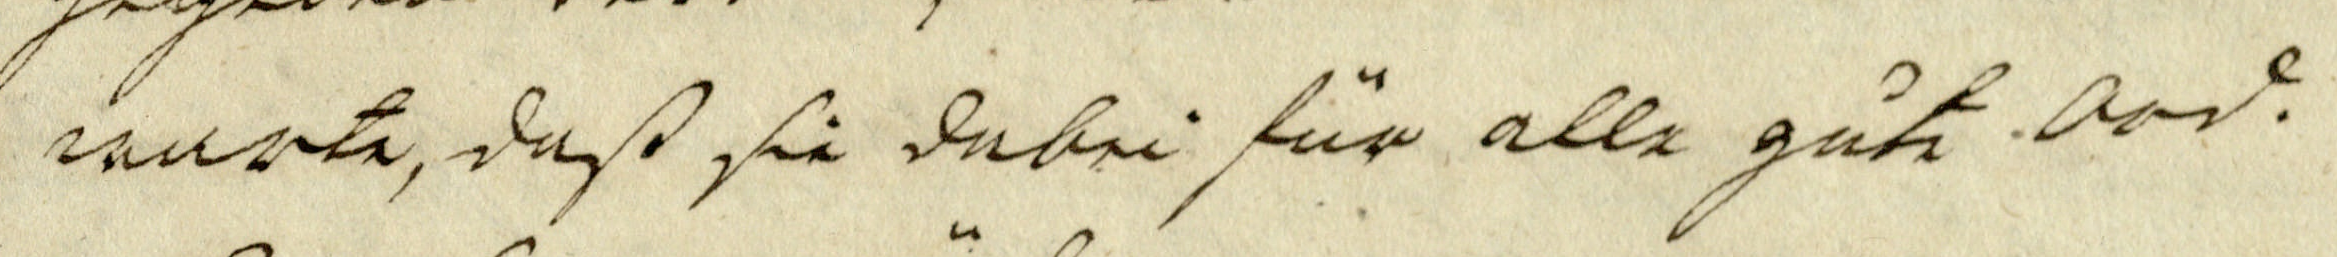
warte, daß sie dabei für alle gute Ord¬
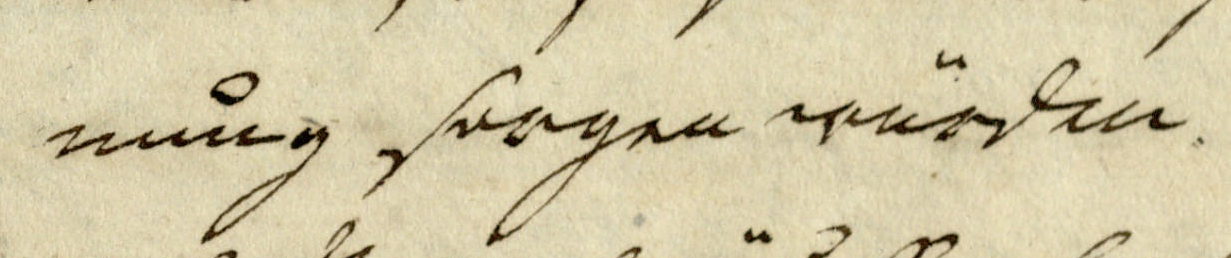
nung sorgen würden.
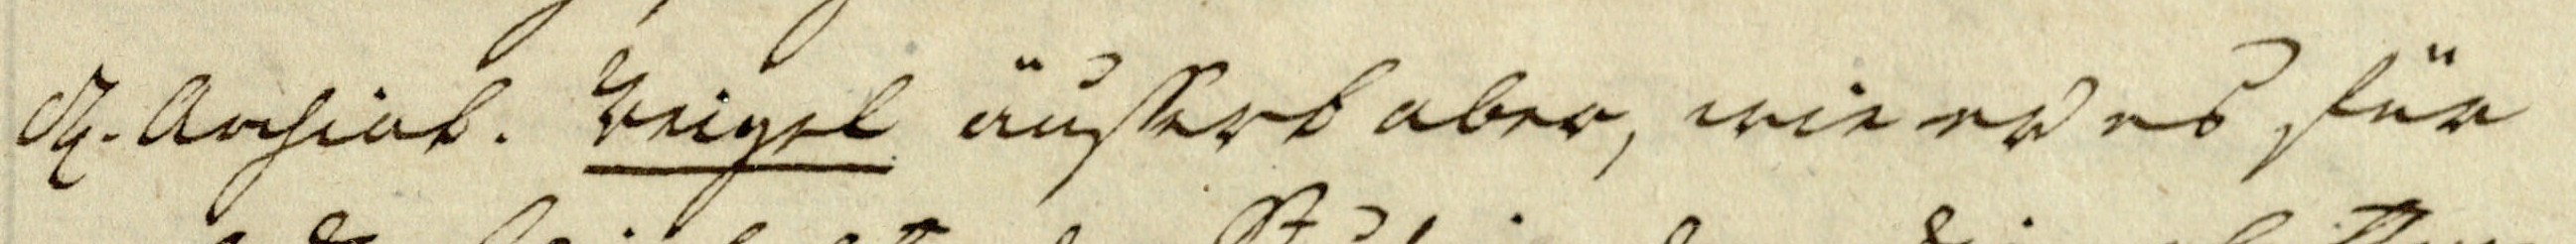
dh. Archiat. Weigel äussert aber, wie er es für
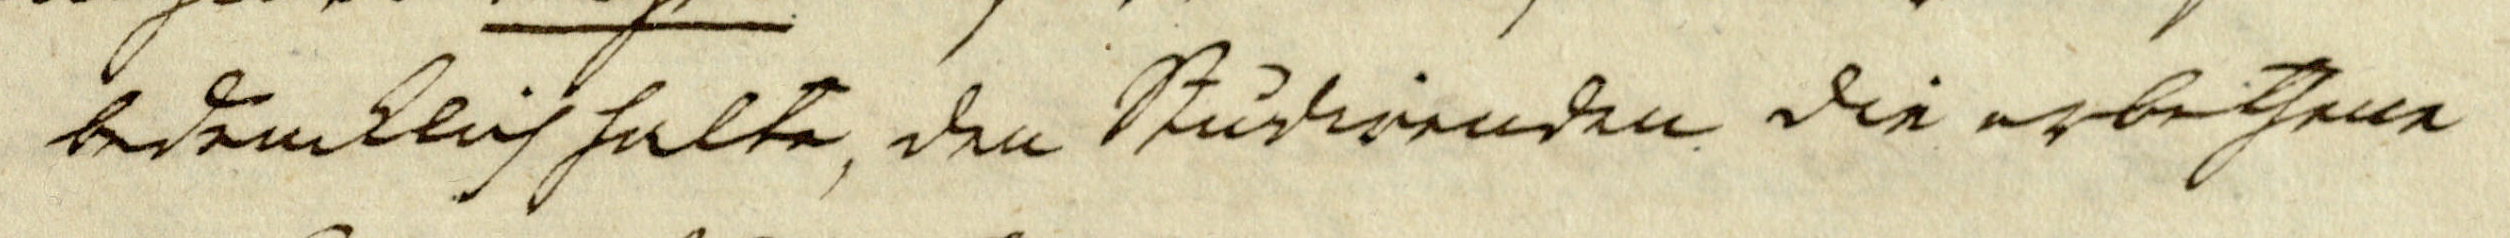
bedencklich halte, den Studirenden die erbethene
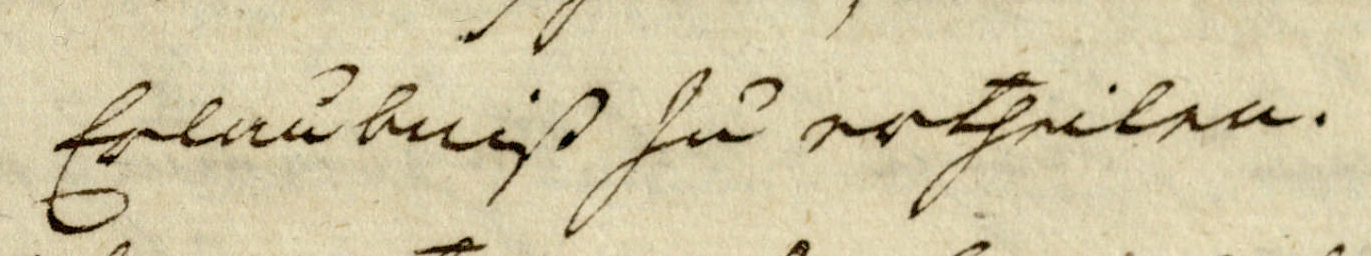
Erlaubniß zu ertheilen.
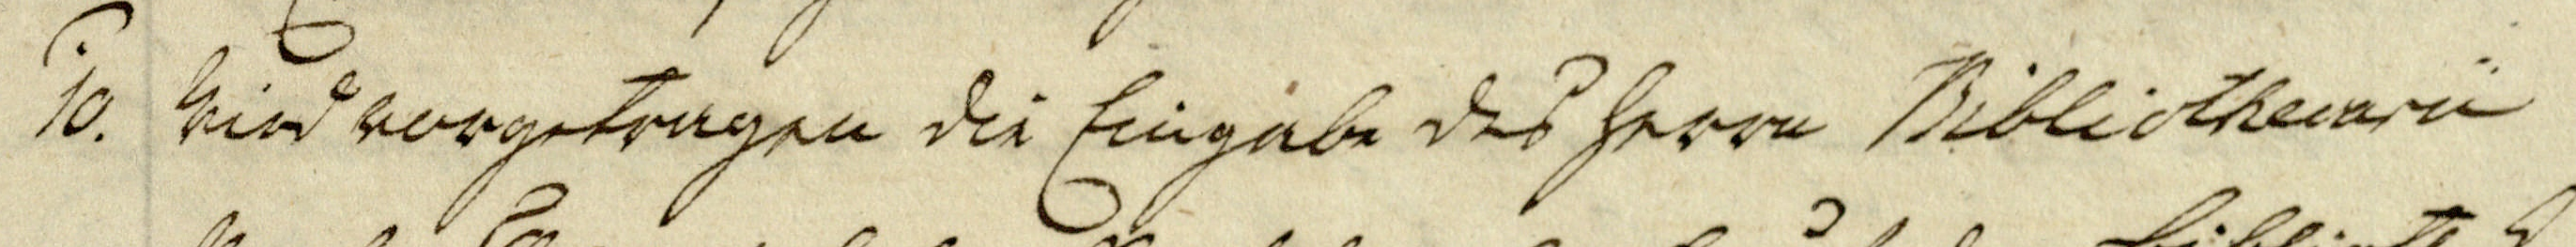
10. Wird vorgetragen die Eingabe des Herrn Bibliothecarii
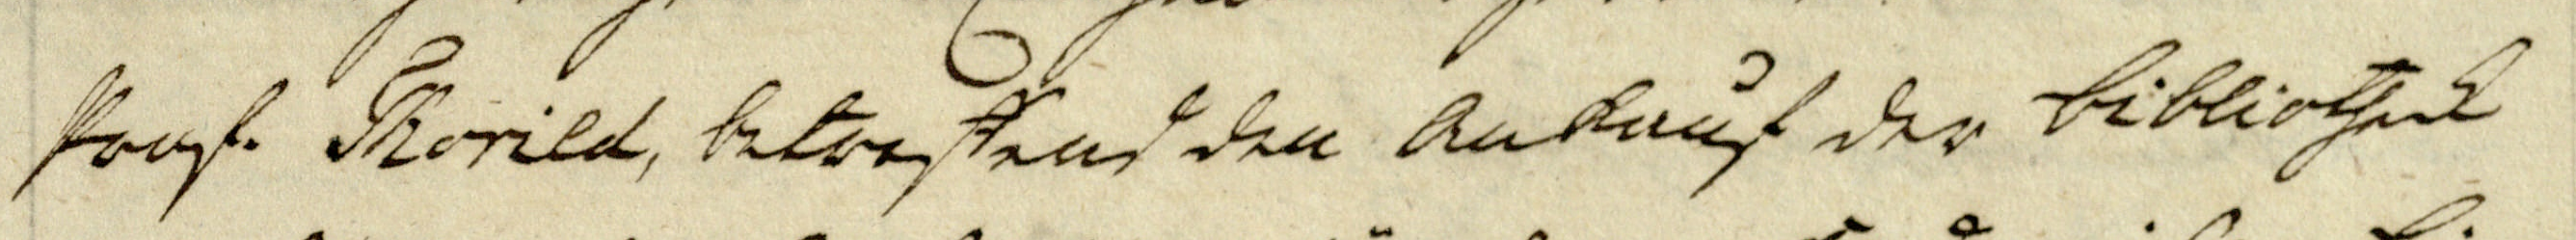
Prof. Thorild, betreffend den Ankauf der Bibliotheck
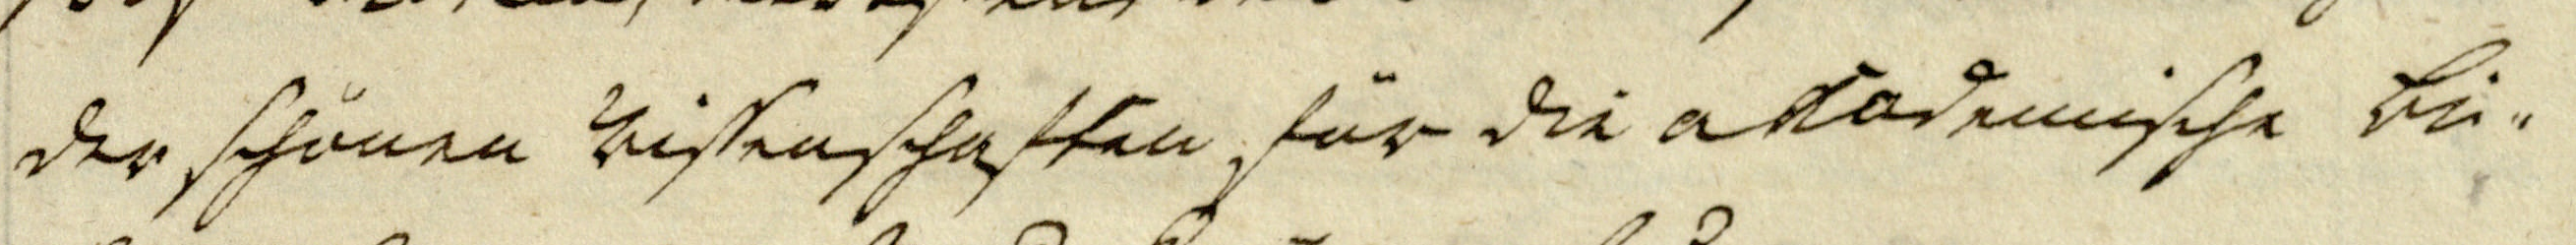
der schönen Wissenschaften für die akademische Bi¬
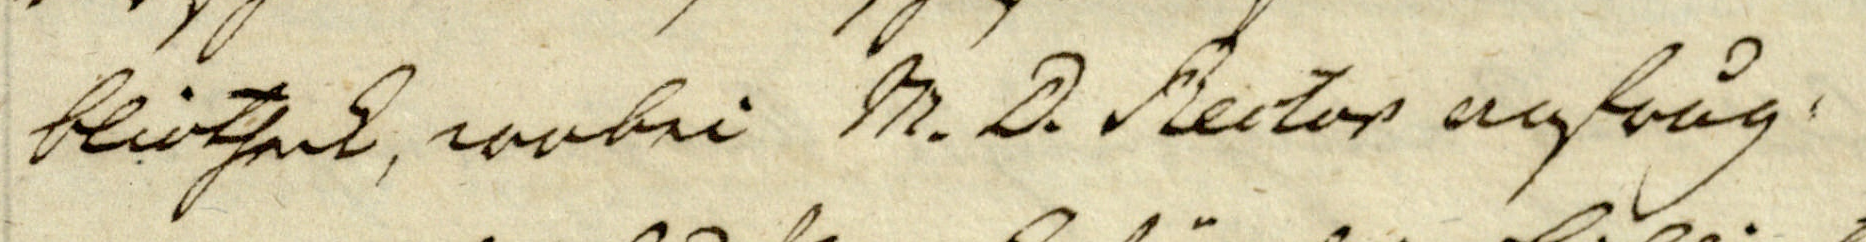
bliotheck, wobei M. D. Rector anfrug:
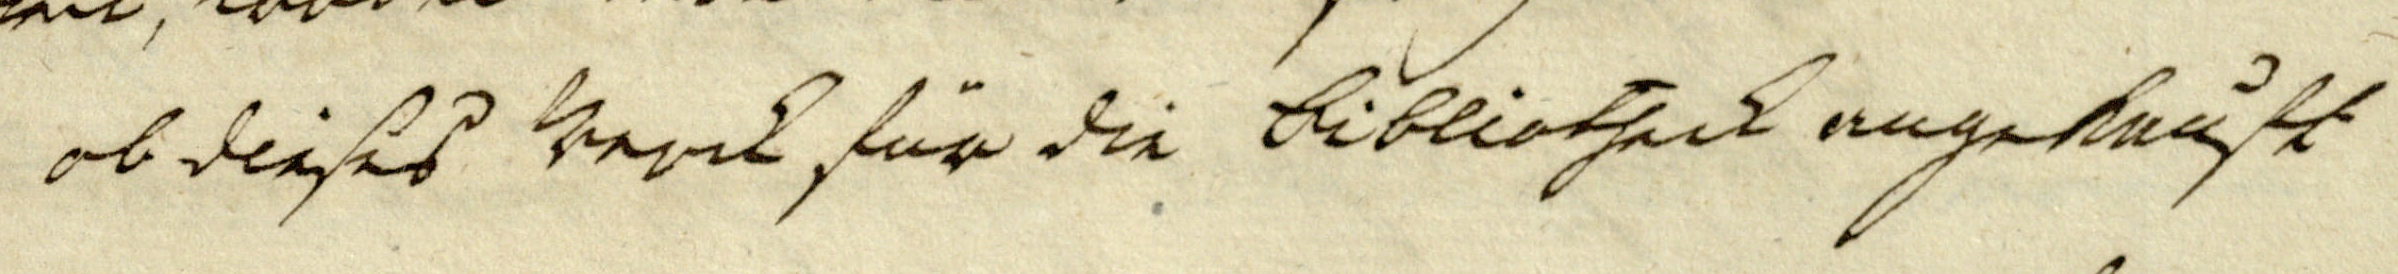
ob dieses Werck für die Bibliothek angekauft
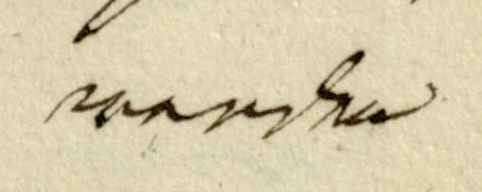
werden
